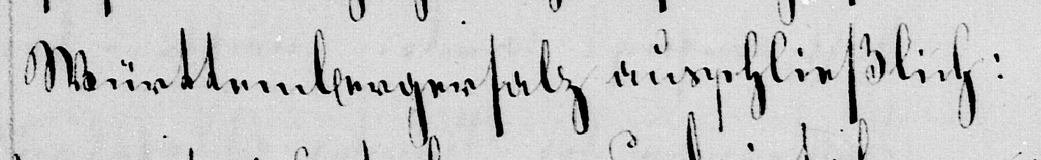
Württembergersalz ausschließlich:
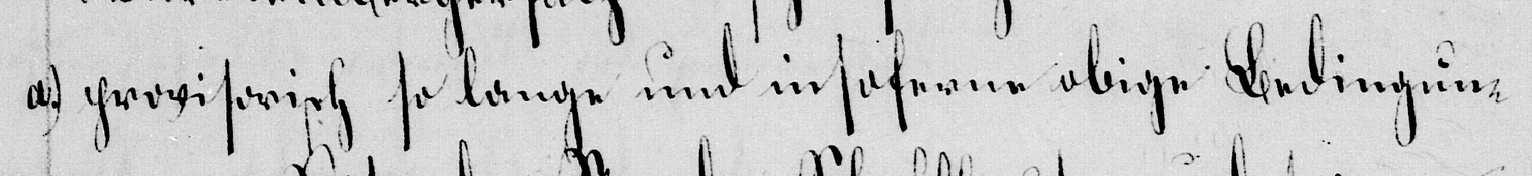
a.) provisorisch so lange und insoferne obige Bedingun¬
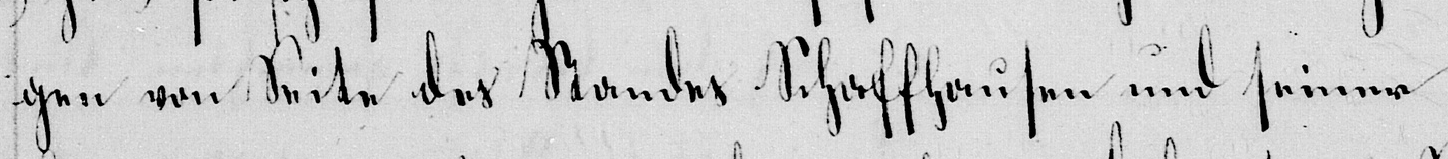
gen von Seite des Standes Schaffhausen und seiner
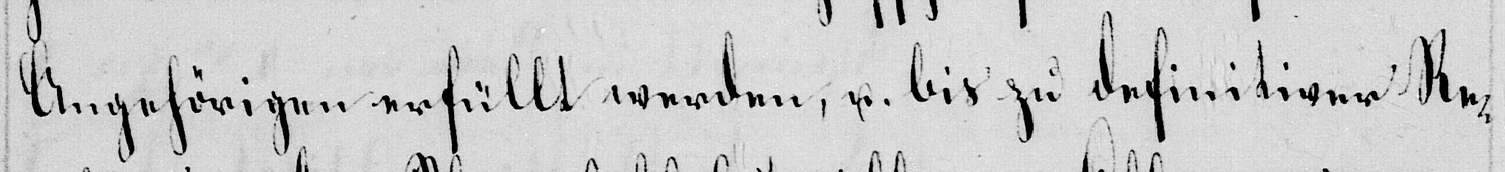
Angehörigen erfüllt werden, u. bis zu definitiver Re¬
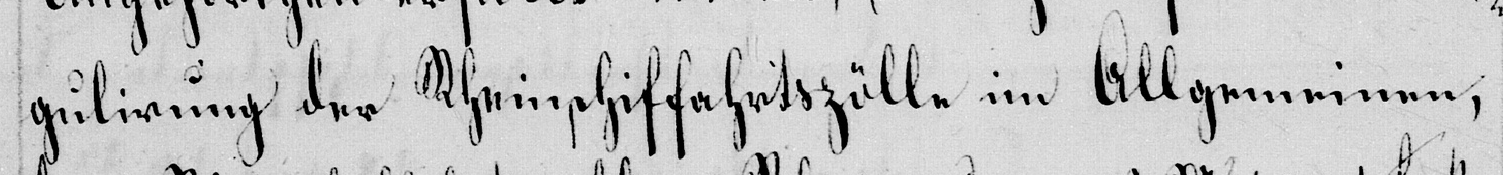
gulirung der Rheinschiffahrtszölle im Allgemeinen,
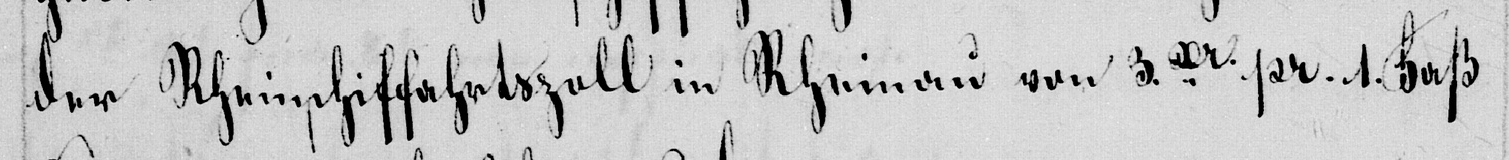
der Rheinschiffahrtszoll in Rheinau von 3.Xr pr. 1. Faß
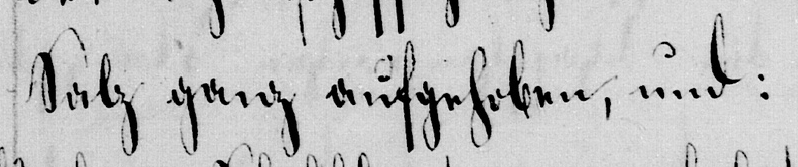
Salz ganz aufgehoben, und:
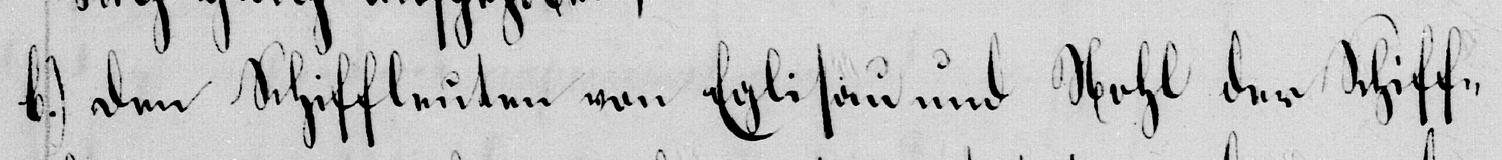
b.) den Schiffleuten von Eglisau und Nohl der Schiff¬
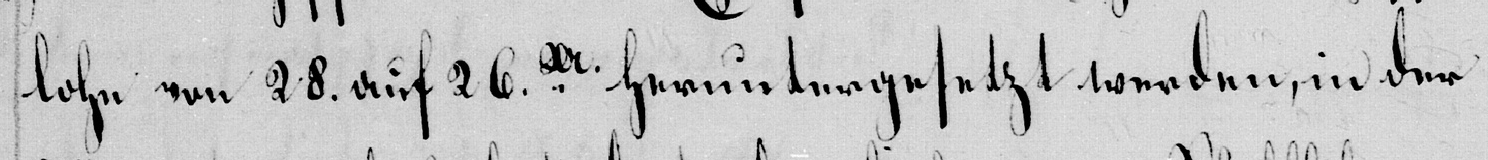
lohn von 28. auf 26.Xr heruntergesetzt werden, in der
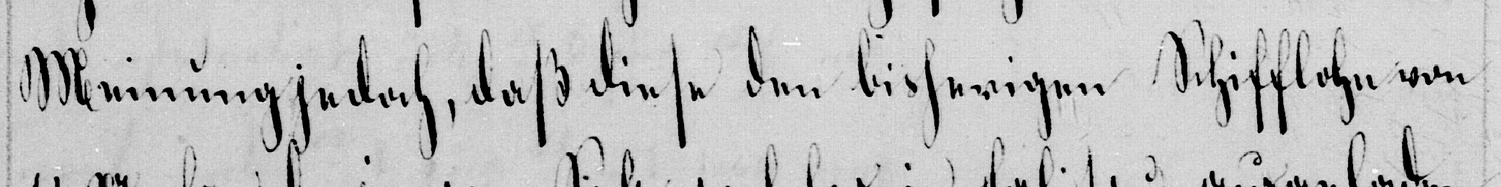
Meinung jedoch, daß diese den bisherigen Schifflohn von
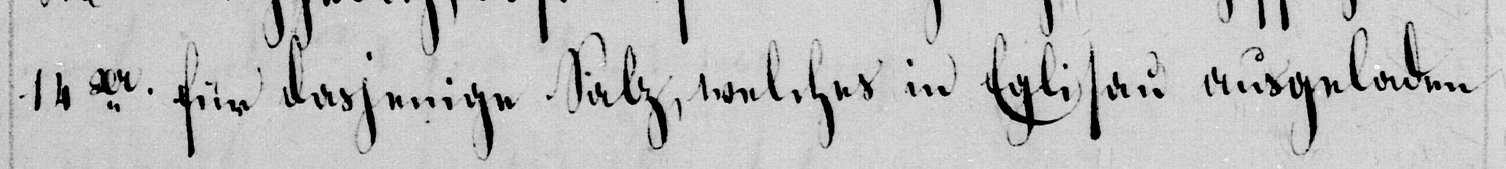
14.Xr für dasjenige Salz, welches in Eglisau ausgeladen
